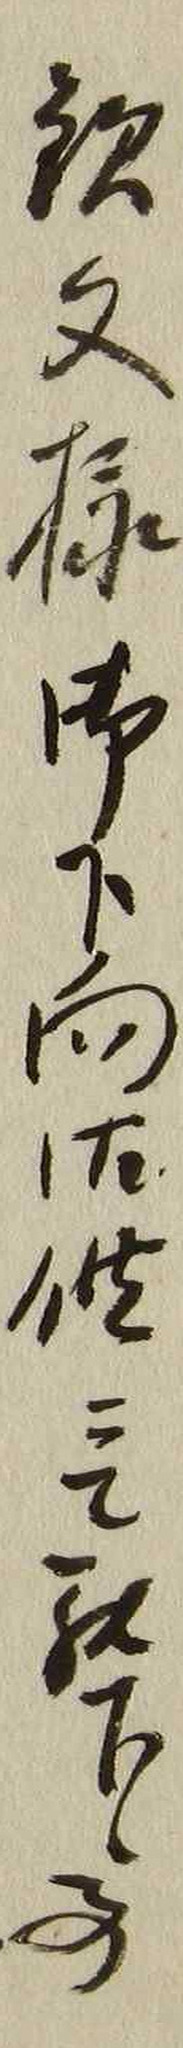欽文様御下向御供ニて罷下候事
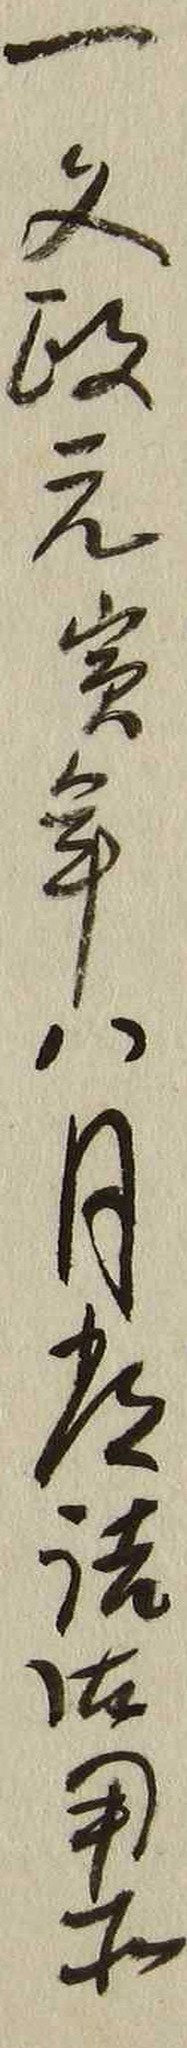一文政元寅年八月常詰御用所
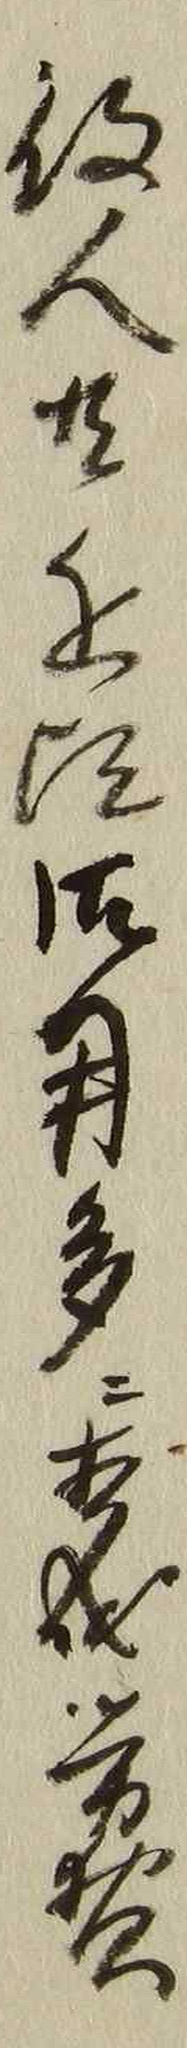役人共近頃御用多ニ相成労費
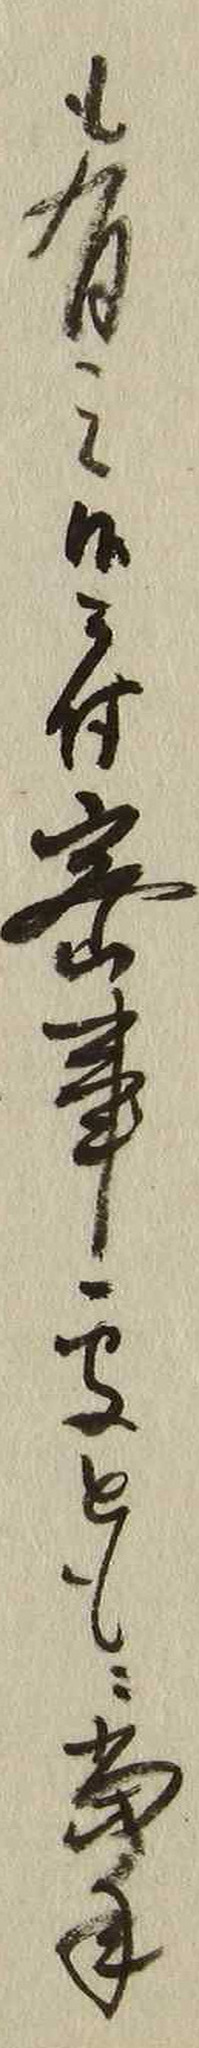も有之候ニ付密事処ともニ当年
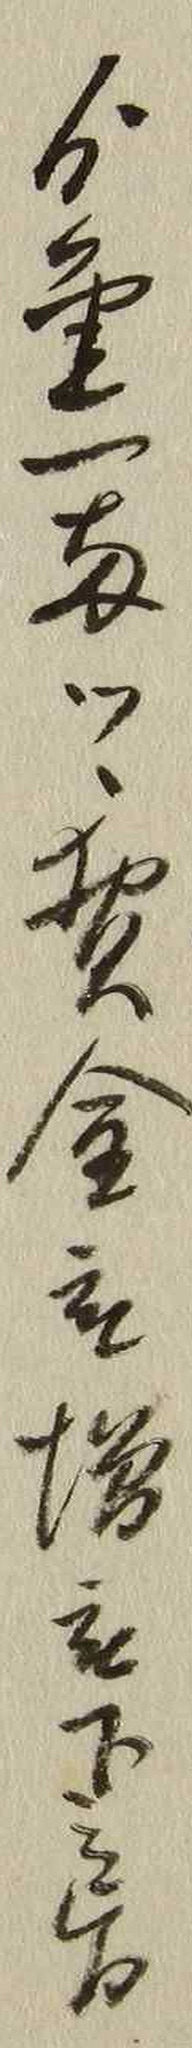ゟ金一両ツヽ費金被増被下之旨
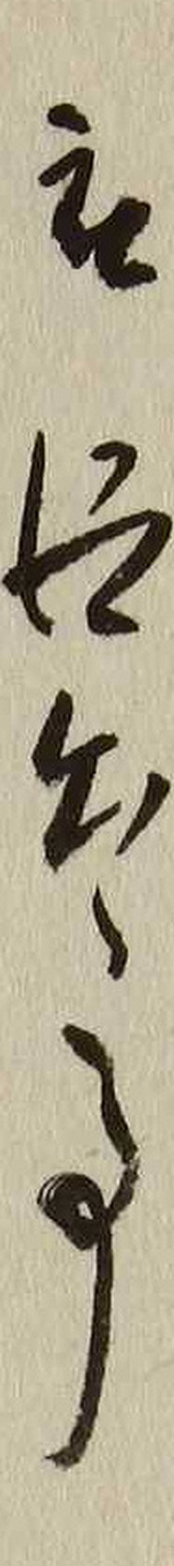被仰出候事
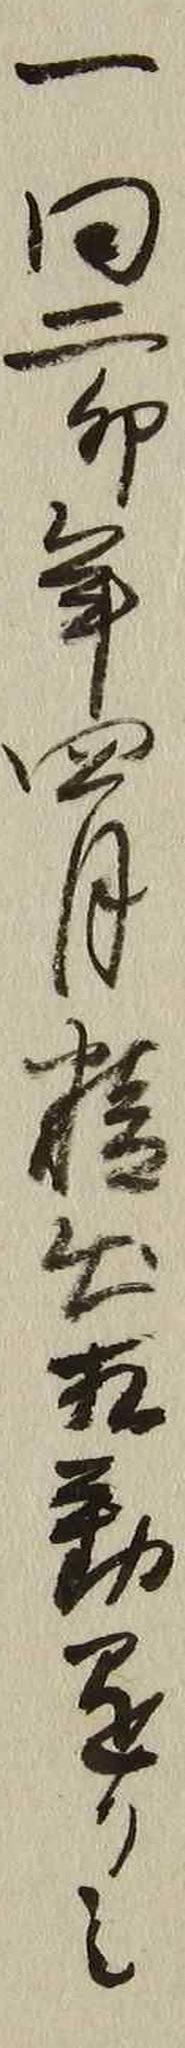一同二卯年四月精出相勤懸り之
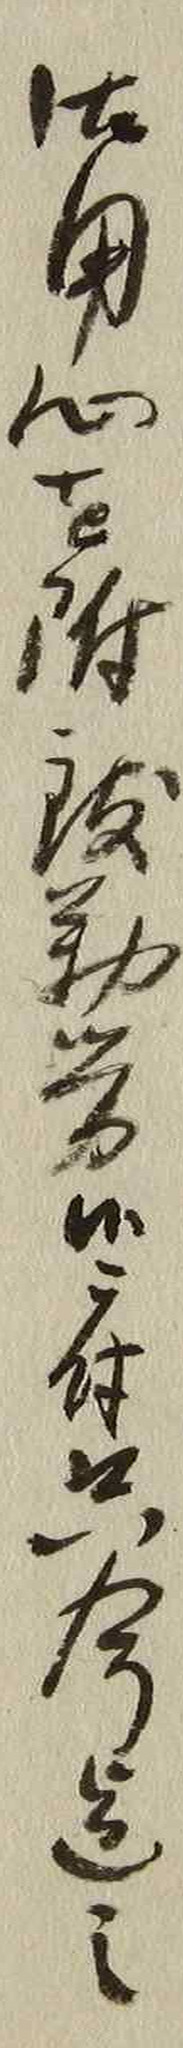御用心を附致勤労候ニ付只今迄之
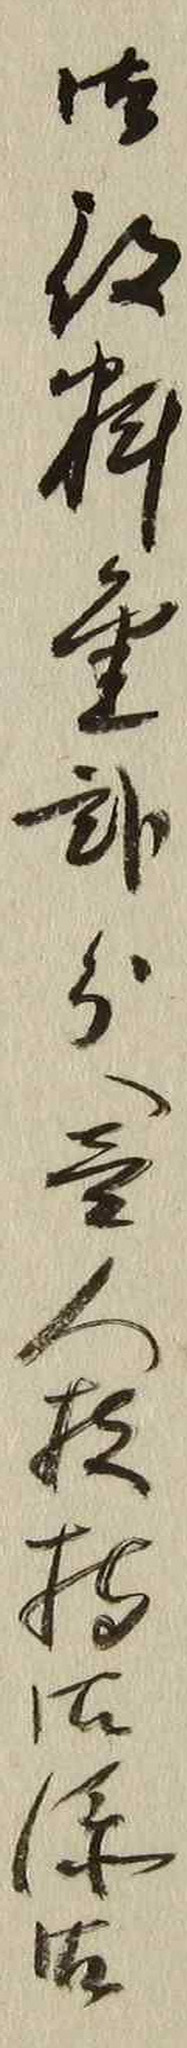御役料金弐分へ壱人扶持御添御
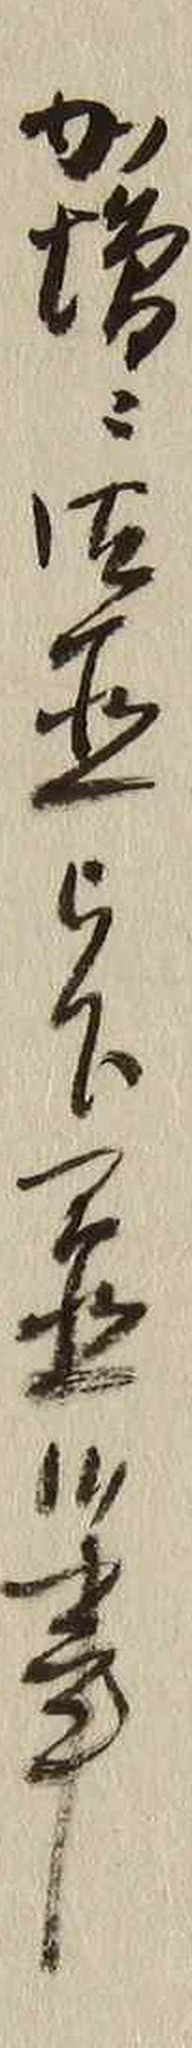加増ニ御直被下置候事
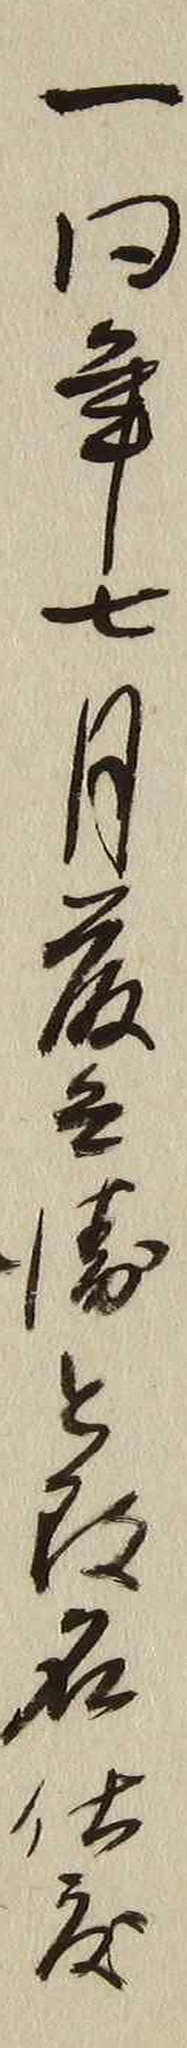一同年七月藤兵衛と改名仕度
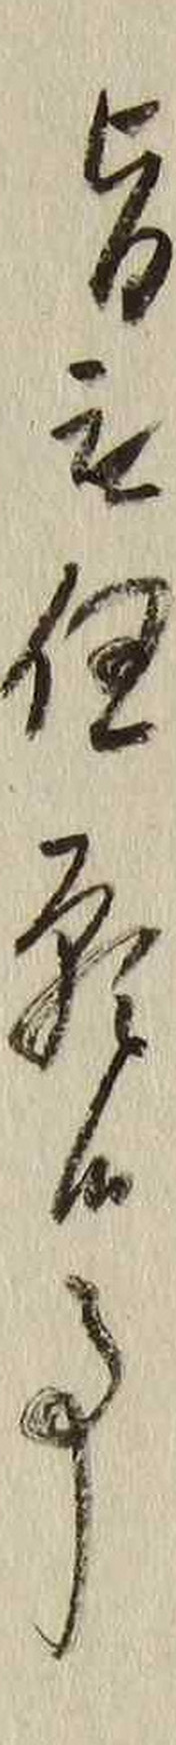旨被任願候事
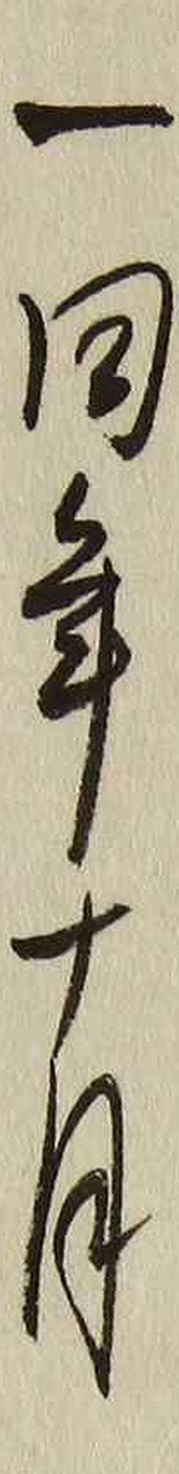一同年十月
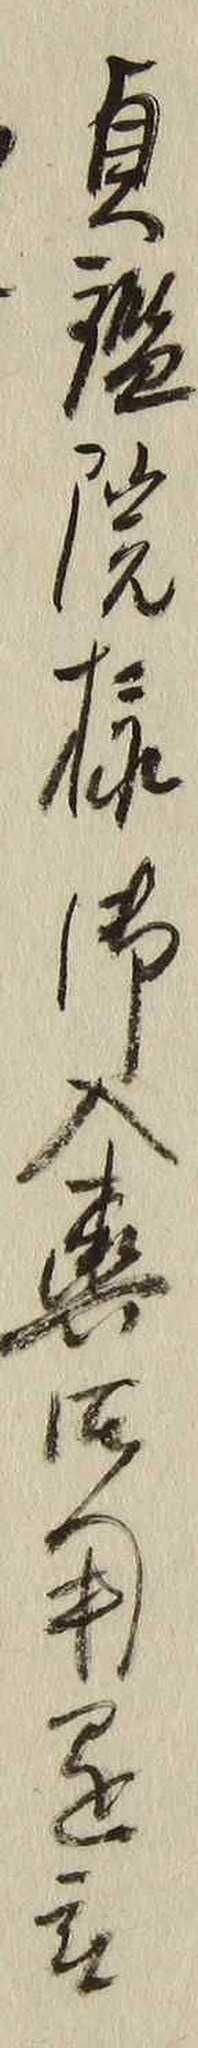貞鑑院様御入輿御用懸被
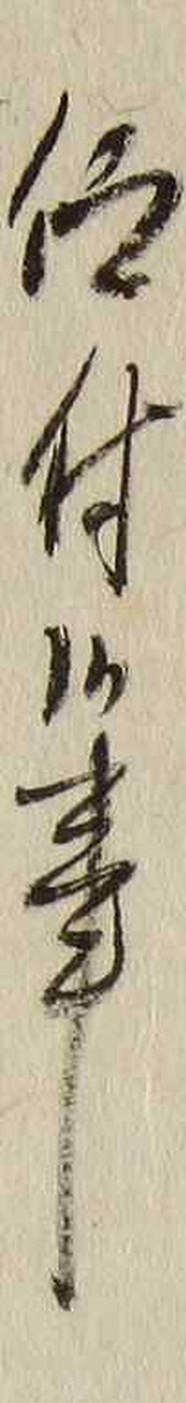仰付候事
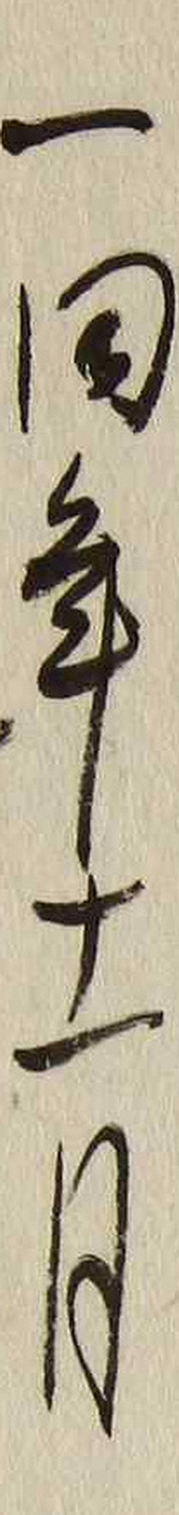一同年十一月
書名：諸士系譜　巻之353　す之部3
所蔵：会津若松市立会津図書館
